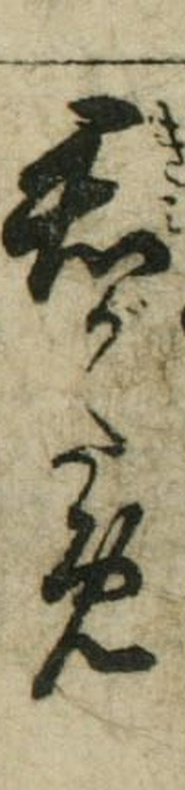君がため
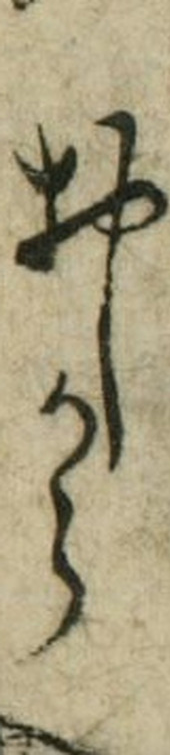おしから
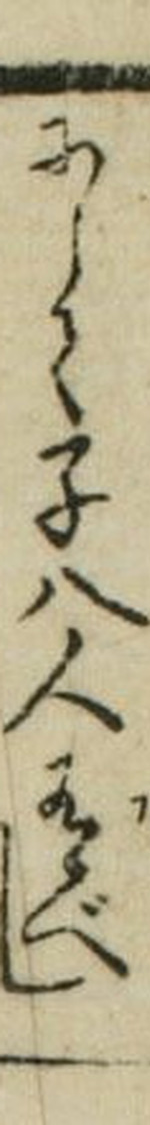にして子八人有べし
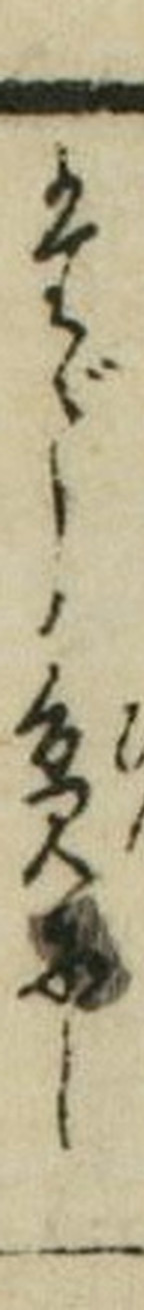たゞし貧にし
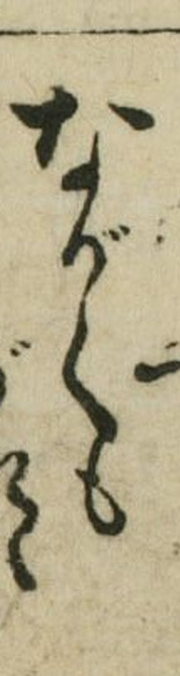ながくも
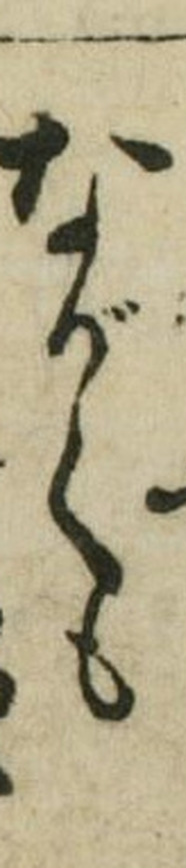ながくも
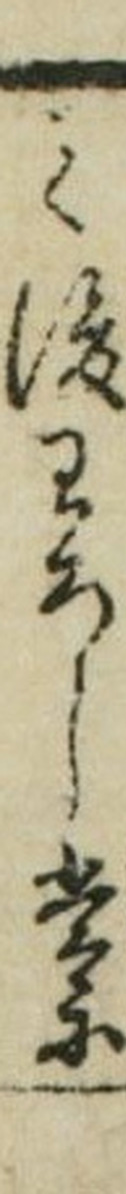て後わろし常に
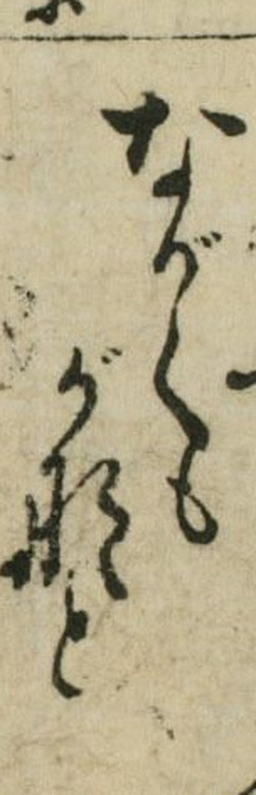がなと
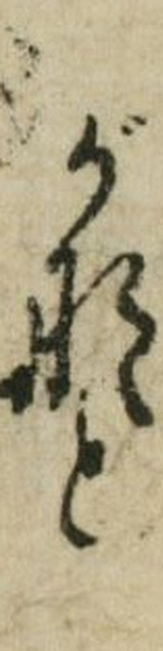がなと
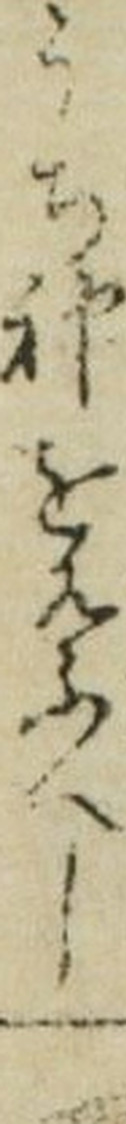うち神を祭へし
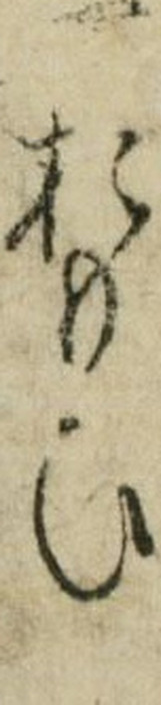おもひ
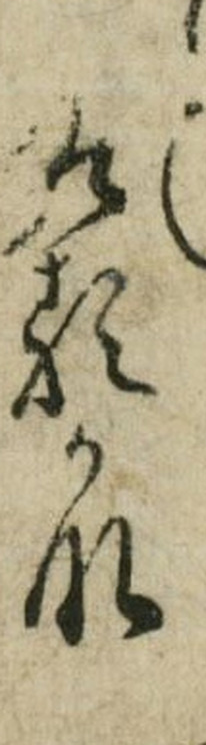けるかな
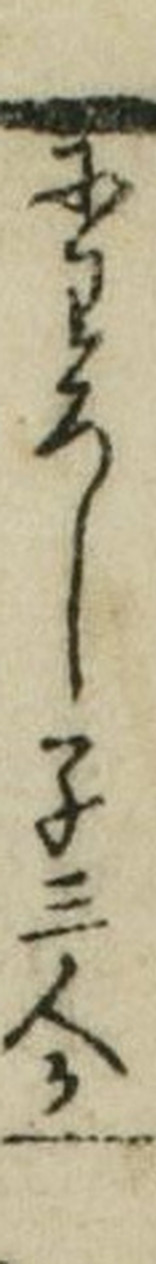にわろし子三人か
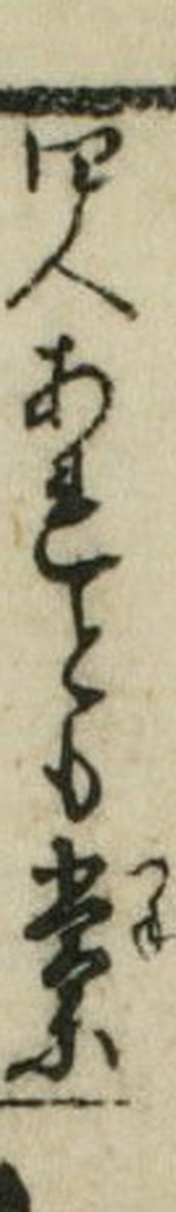四人あれとも常に
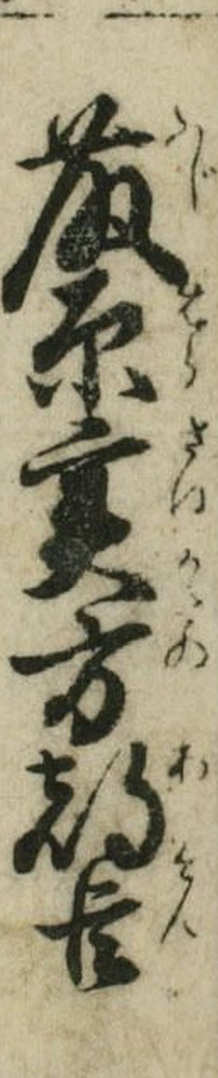藤原実方朝臣
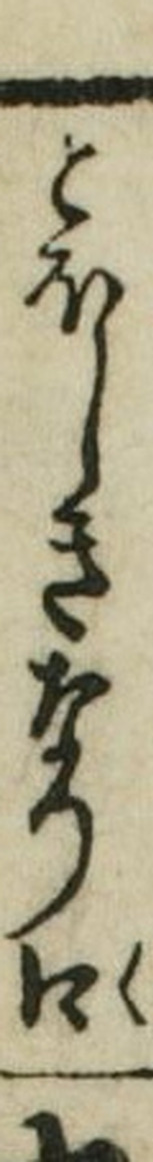とほしきなり口
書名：百人一首
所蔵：東京学芸大学教育コンテンツアーカイブ
